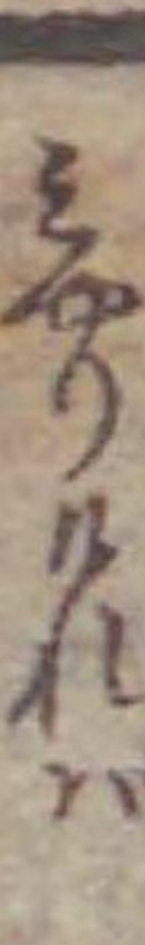みやりければ
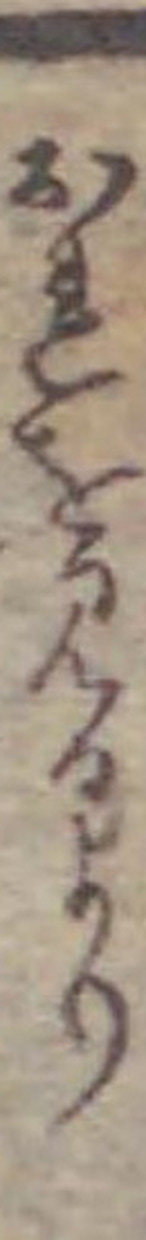おれを見るより
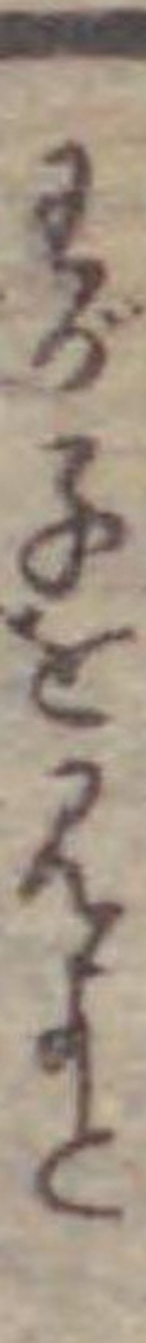わが子を見よと
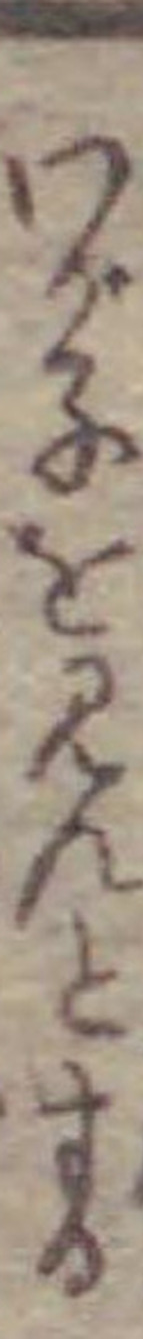わが子を見んとする
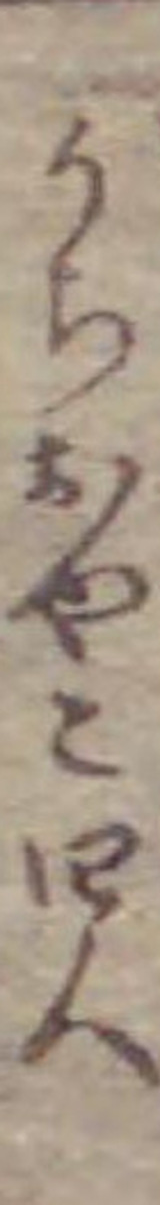うちおやこ四人
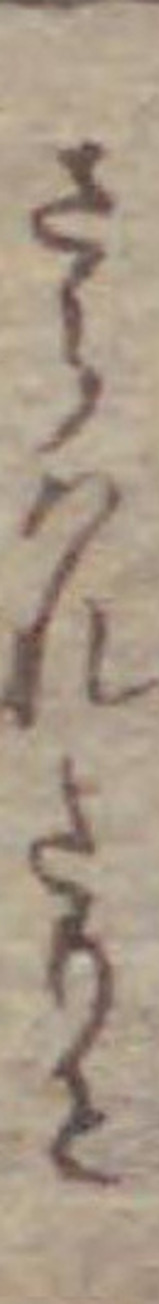さらはれたりと
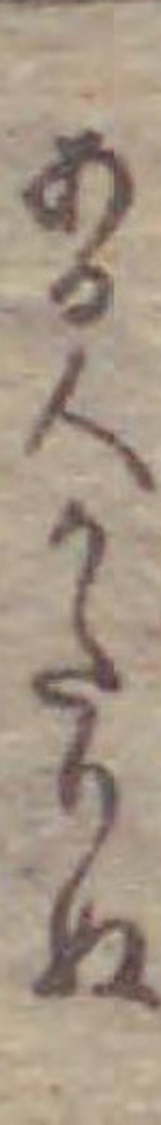ある人かたりぬ

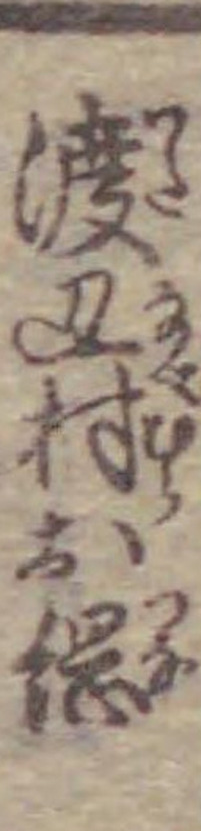渡辺村お綱
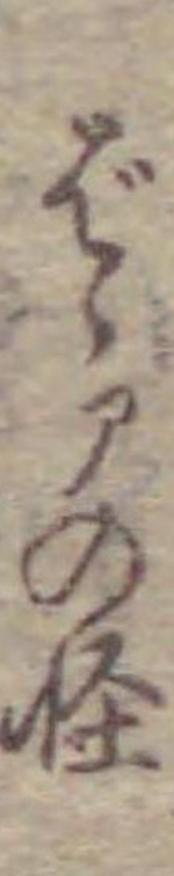ばゝあの怪
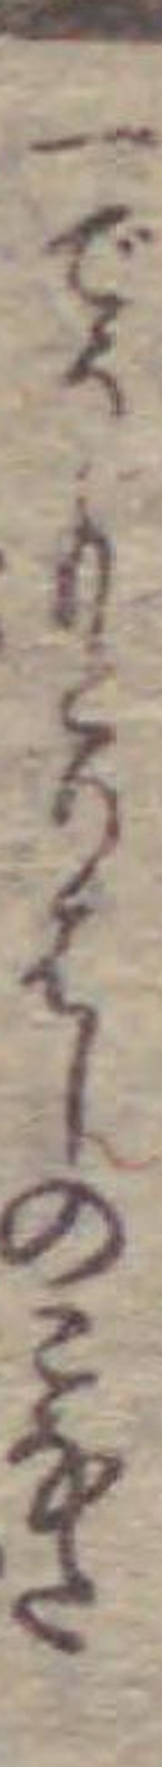一でうもとりはしのこなた
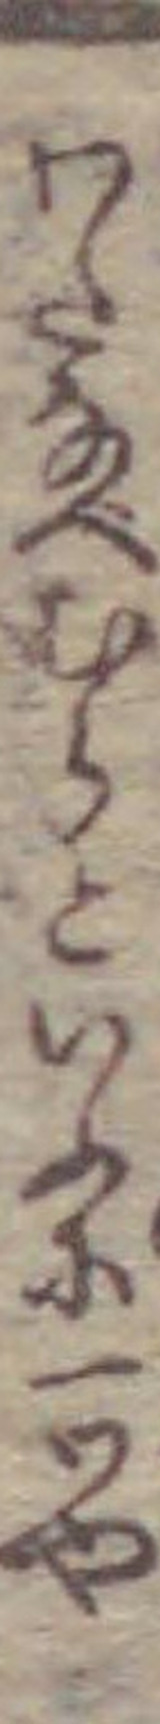わたなべむらといふに一つや
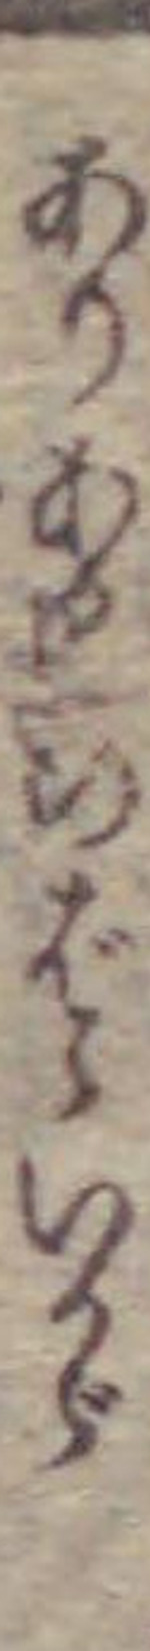ありあるしのばゝいかゞ
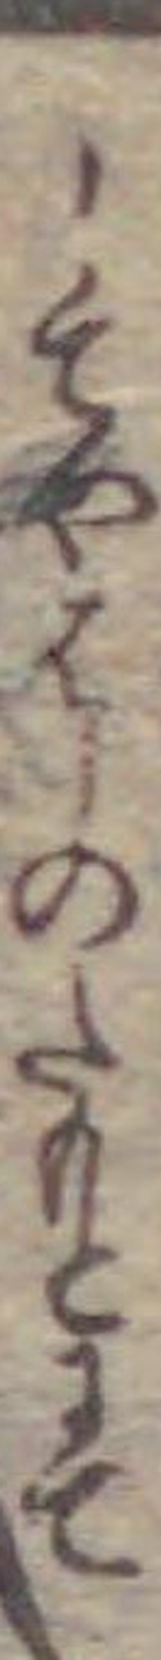してやはしのたもとにて
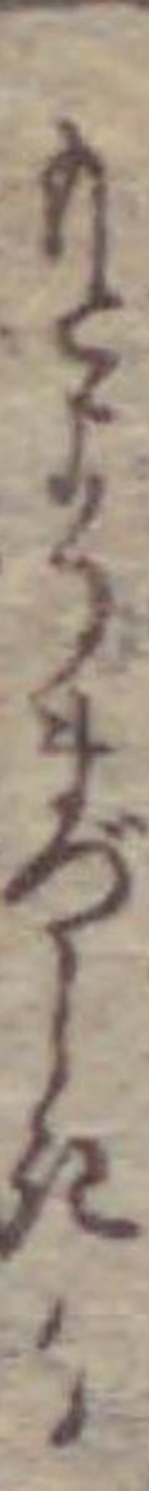もとよりまづしき
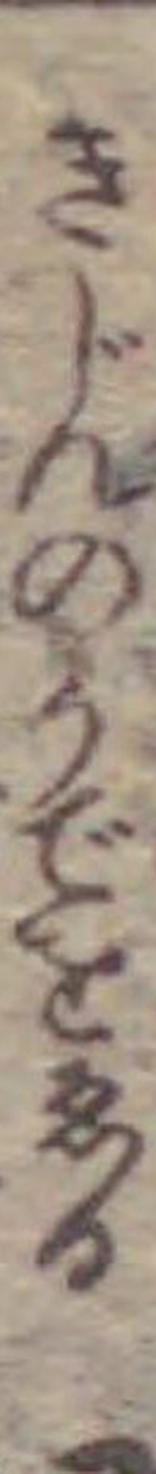きじんのうでをゑる
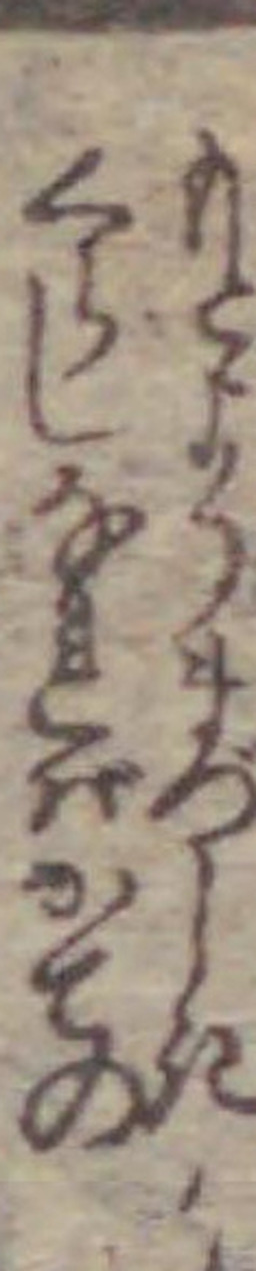くらしなればかての
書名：武家物奇談 : 3巻
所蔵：国立国会図書館 National Diet Library, JAPAN
